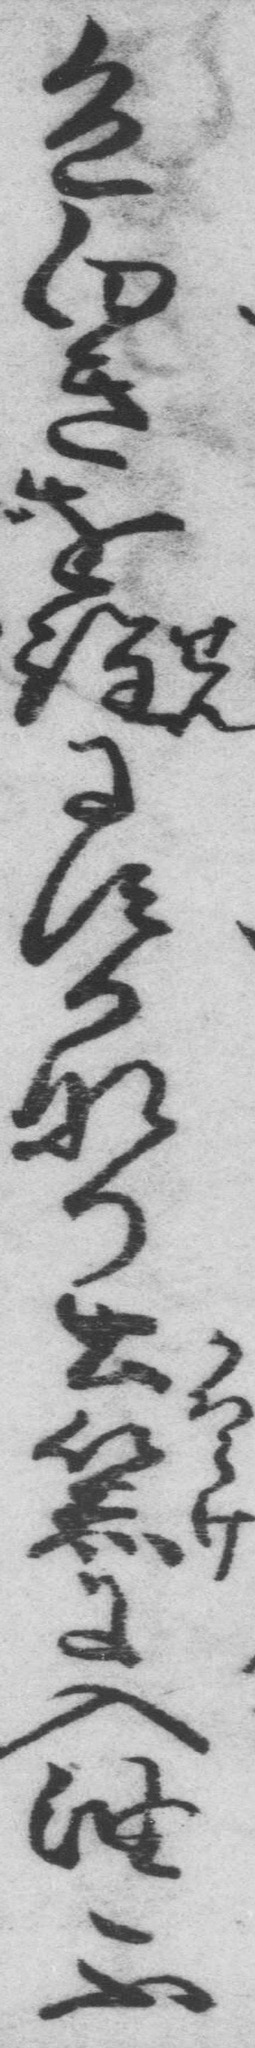色白きを詮にするなり土器に入油不
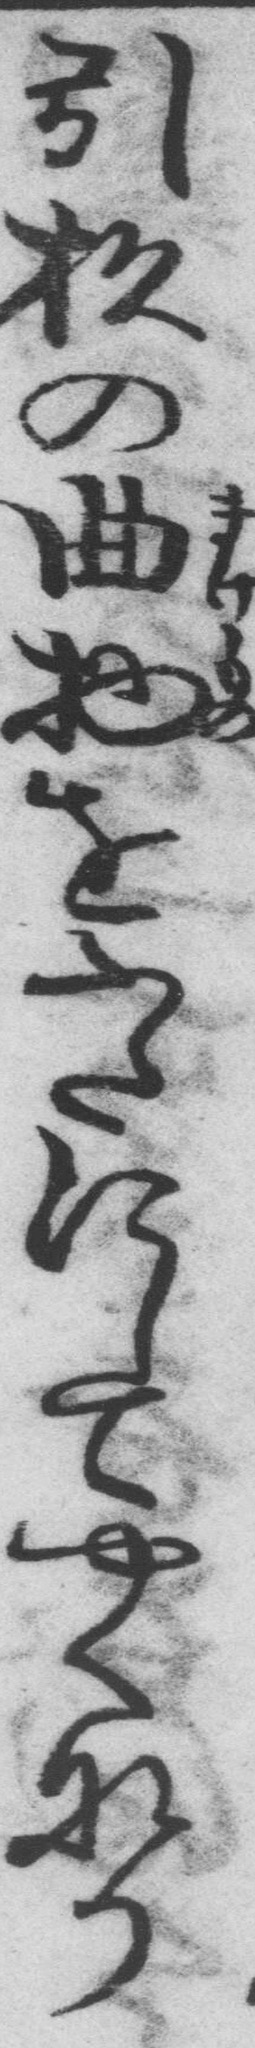引杉の曲物をふたにしてやくなり
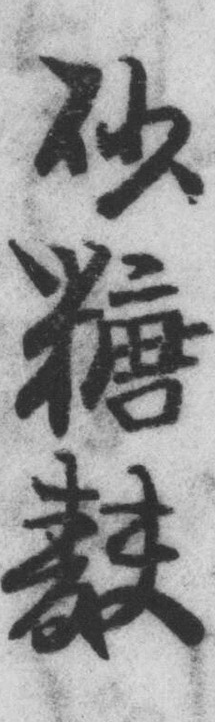砂糖麩
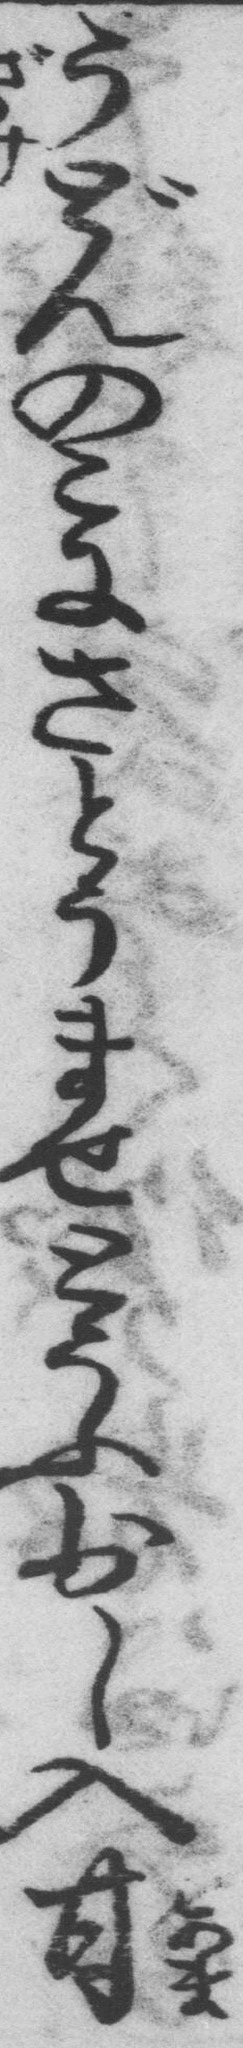うどんのこにさとうませとうふ少し入甘
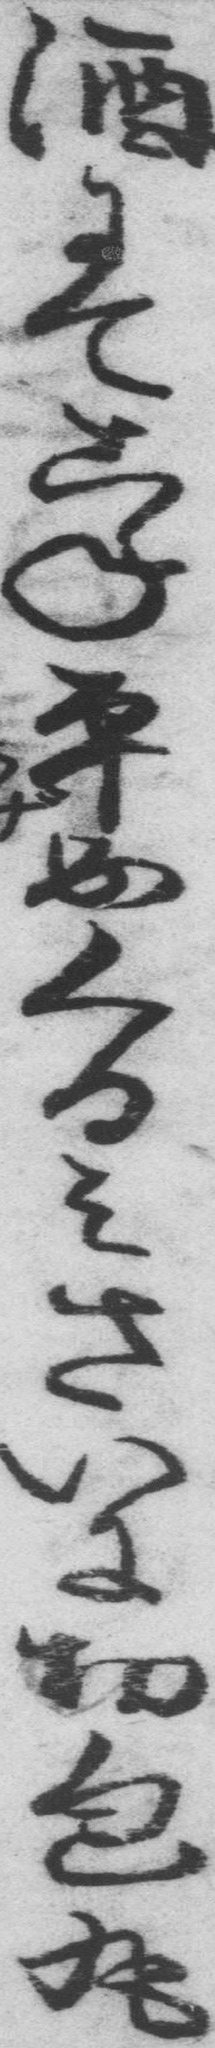酒にてこね平めくるみさいに切包丸
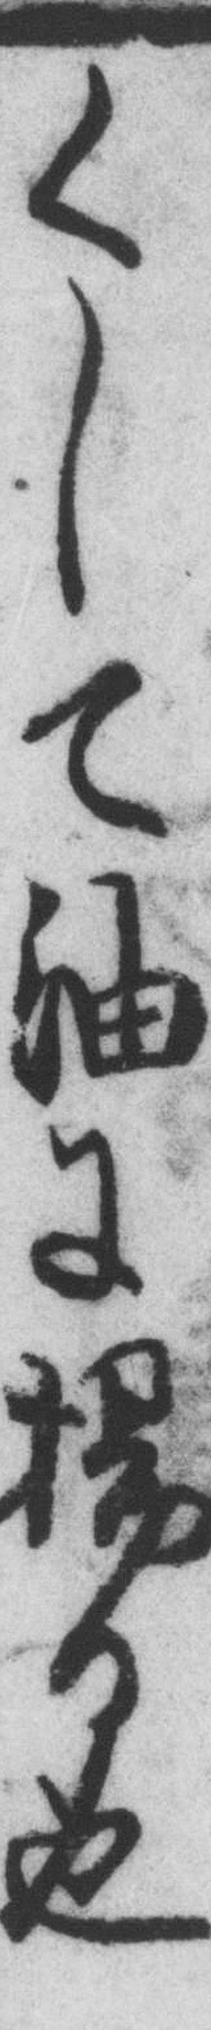くして油に揚る也
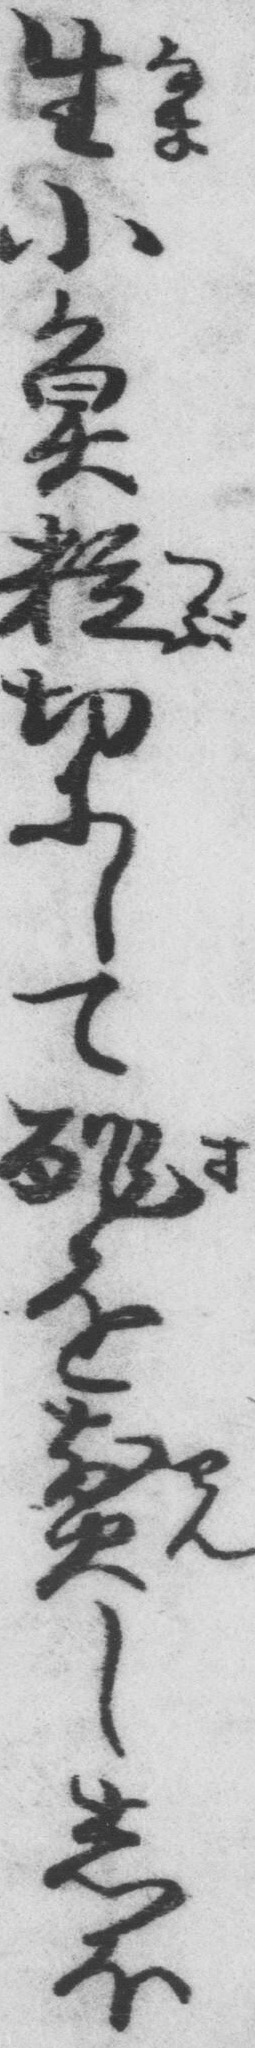生小魚粒切にして酢を煎ししほ
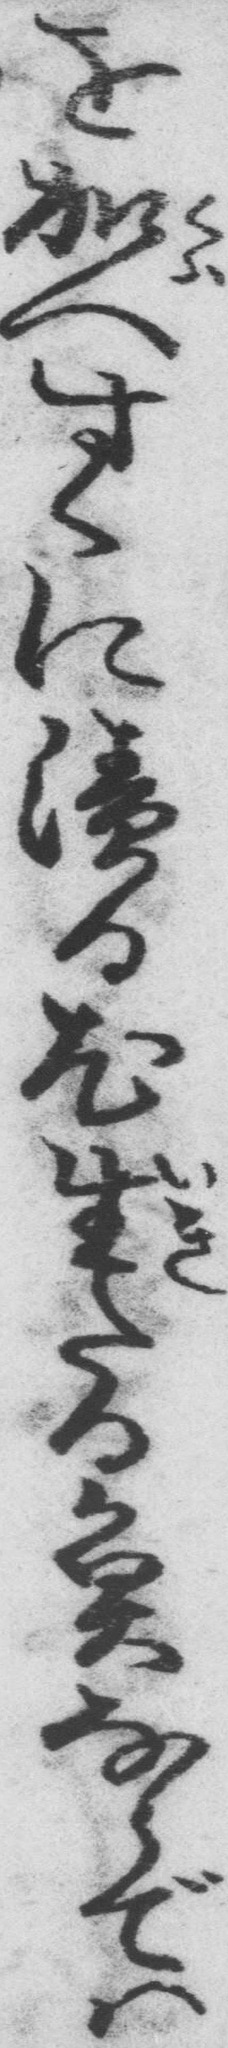を加へすくに漬る尤生たる魚ならでは
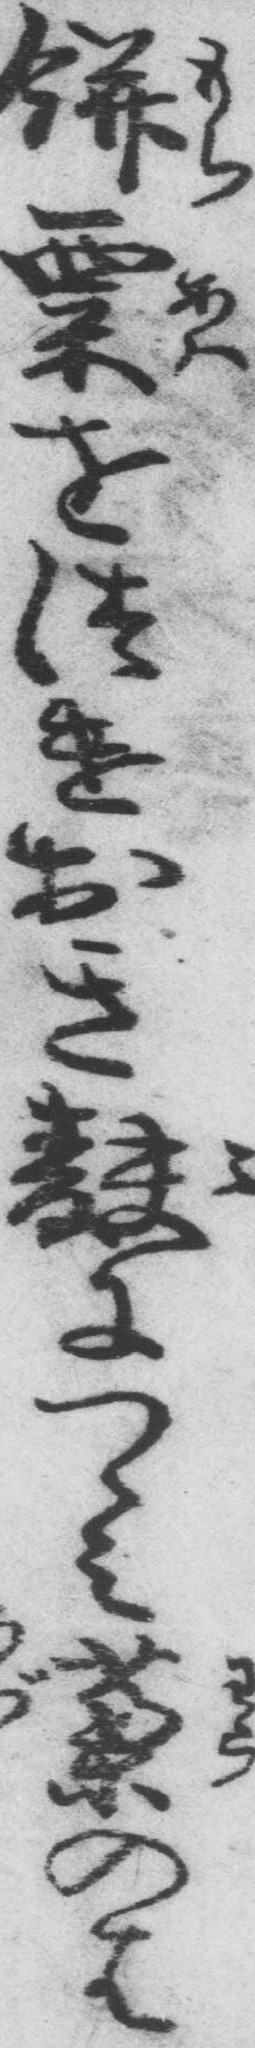餅粟をつけおき麩につゝみ藁のは
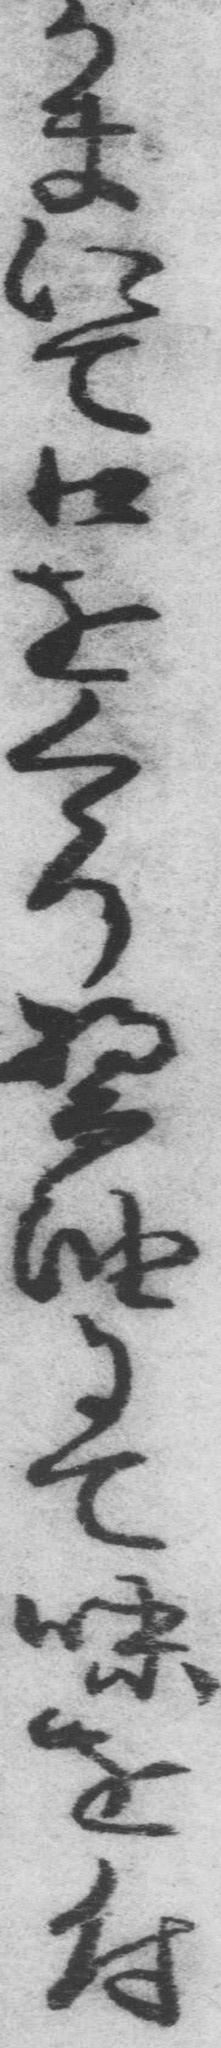かまにて口をくり醤油にて味を付

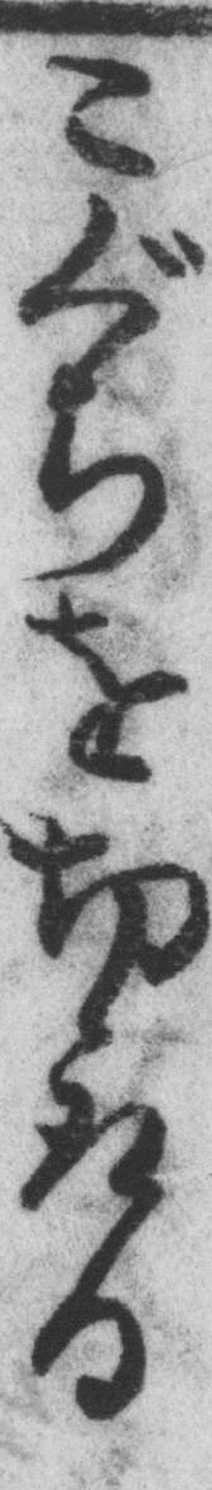こぐちを切取る
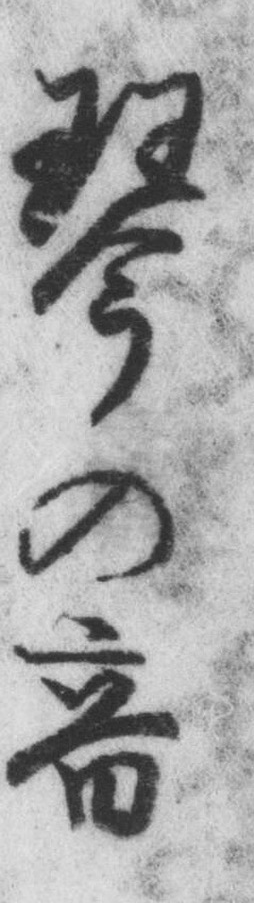琴の音
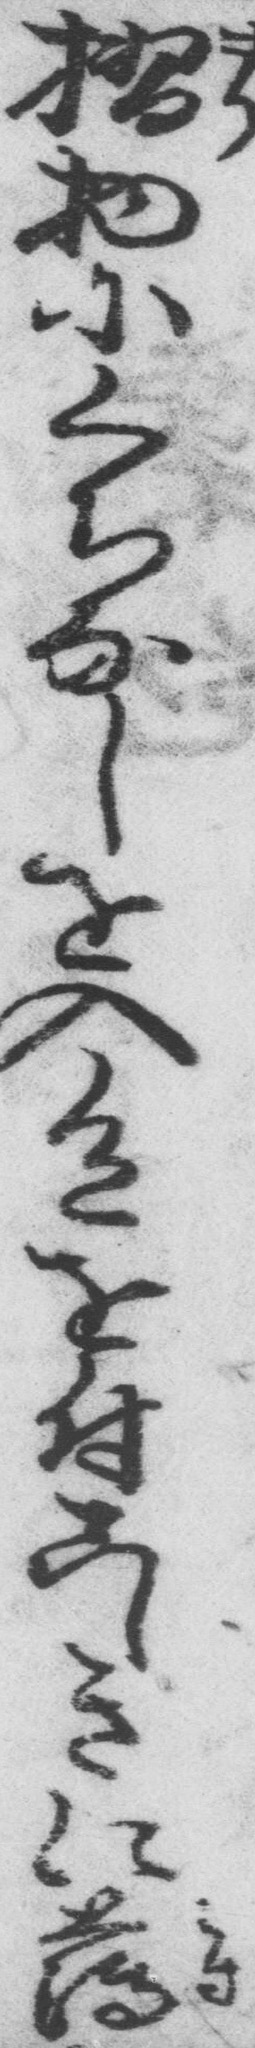摺物にくちなしを入水を付こしきに薄
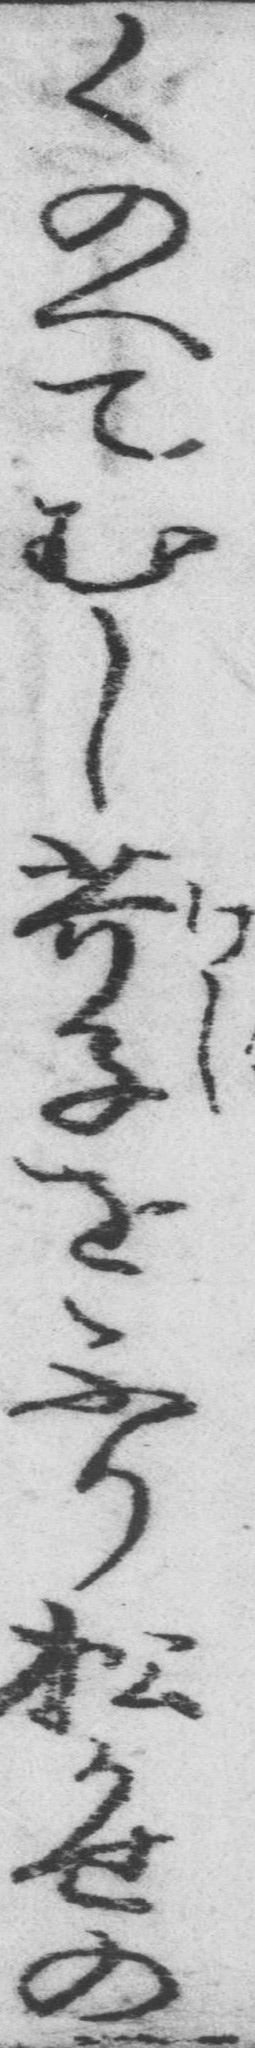くのへてむし芥子をふり松かせの
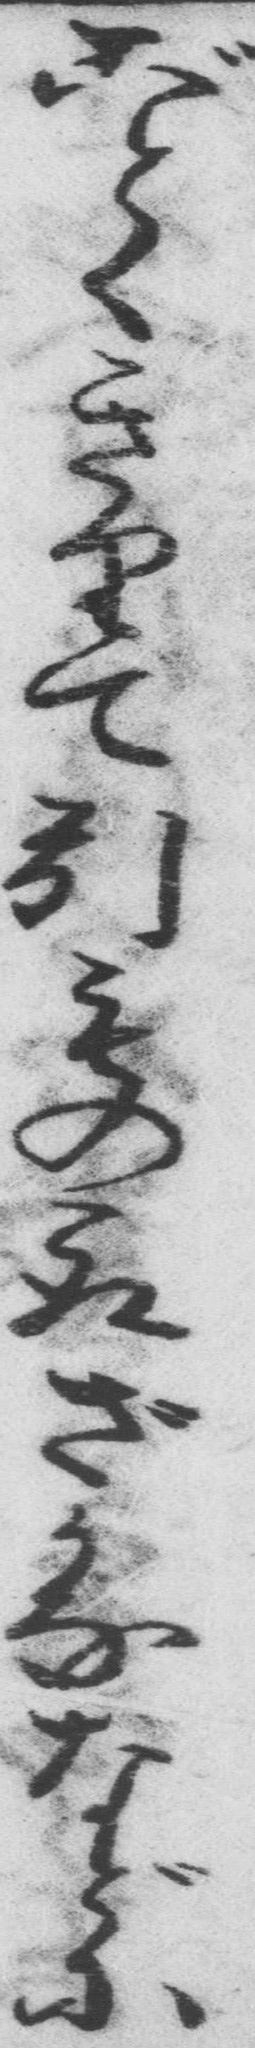ごとくきりて引もの取ざかななどに
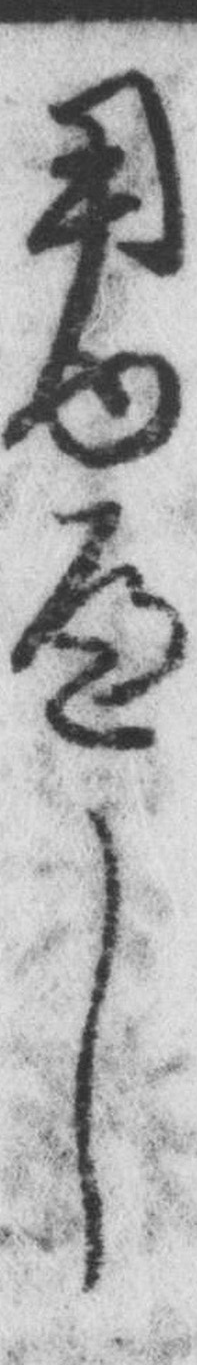用ゆべし
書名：料理山海郷
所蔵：大阪府立大学学術情報センター 国文学研究資料館
